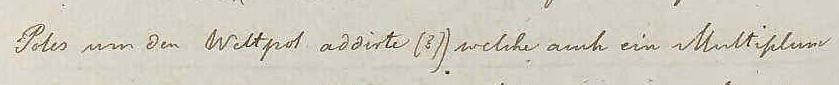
Art eine Periode, welche auch ein Multiplum
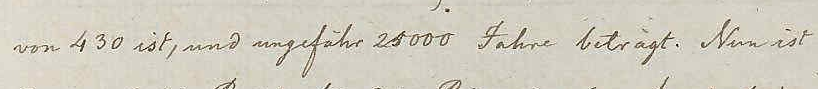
von 430 ist, und ungefähr 25000 Jahre beträgt. Nun ist
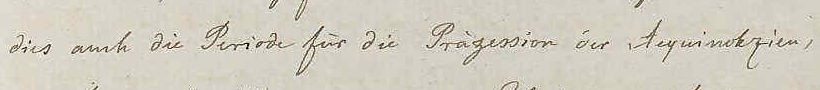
dies auch die Periode für die Präzession der Aequinokzien,
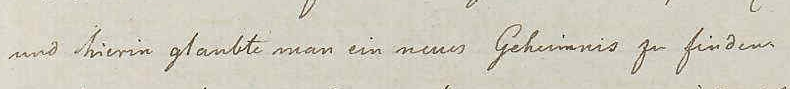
und hierin glaubte man ein neues Geheimnis zu finden.
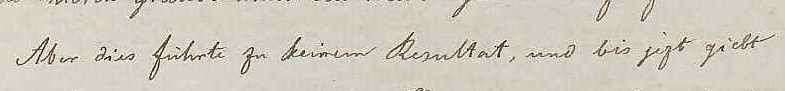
Aber dies führte zu keinem Resultat, und bis jezt giebt
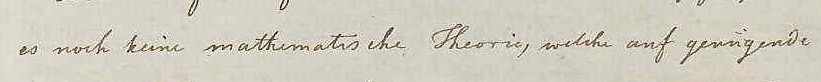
es noch keine mathematische Theorie, welche auf genügende
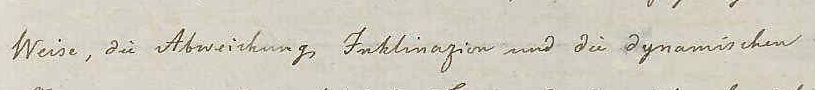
Weise, die Abweichung, Inklinazion und die dynamischen
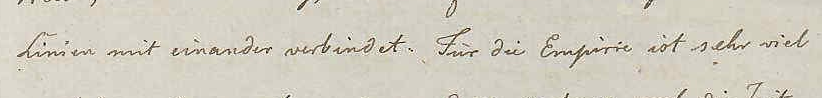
Linien mit einander verbindet. Für die Empirie ist sehr viel
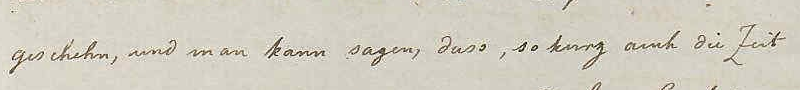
geschehn, und man kann sagen, dass, so kurz auch die Zeit
